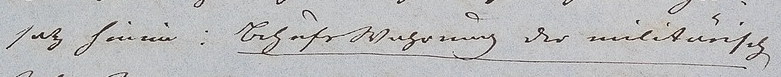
satz hinein: Behufs Wahrung der militärischen
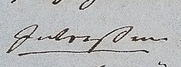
Intressen. –
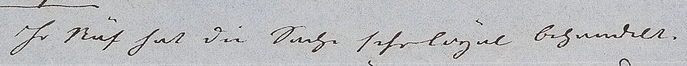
Hr Näf hat die Sache sehr loyal behandelt.
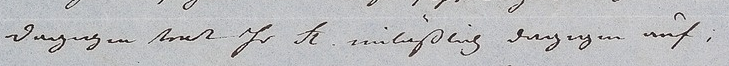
Dagegen trat Hr St. einläßlich dagegen auf;
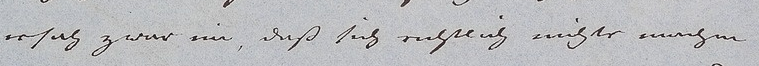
er sah zwar ein, daß sich rechtlich nichts machen
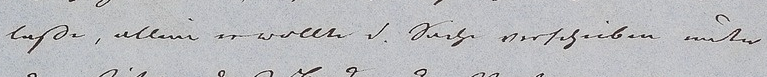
lasse, allein er wollte d. Sache verschieben unter
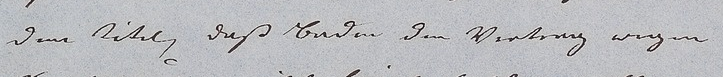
dem Titel, daß Baden den Vertrag wegen
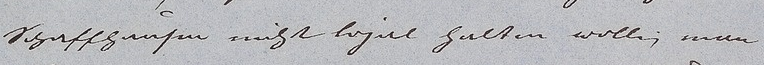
Schaffhausen nicht loyal halten wolle; man
